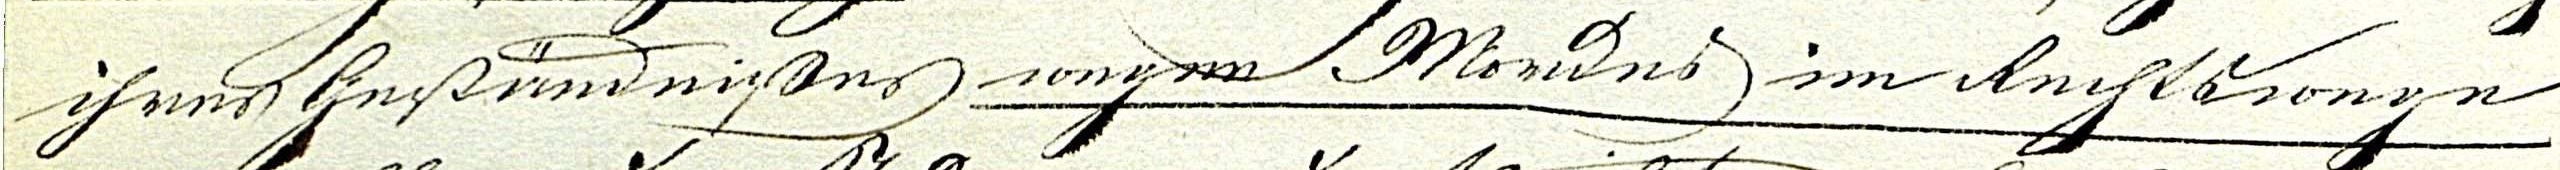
ihres Geständnißes wegen Mordes im Rechtswege
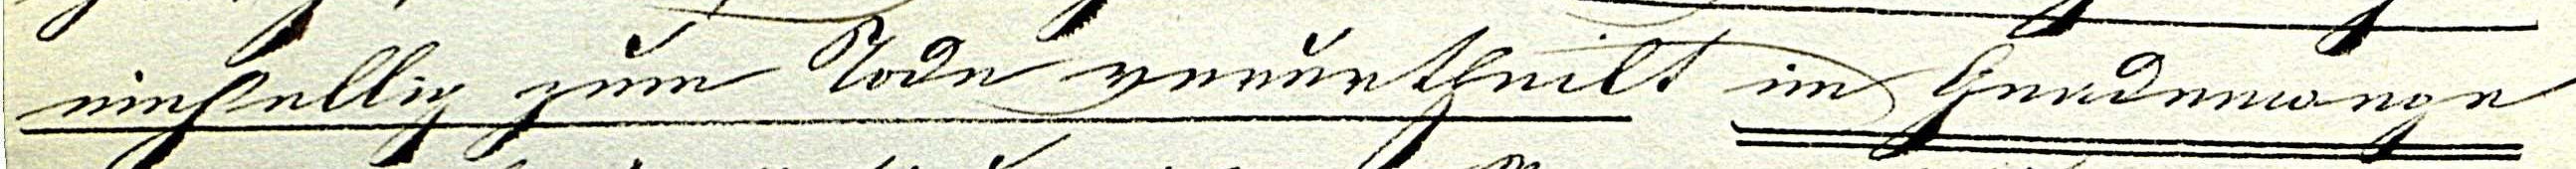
einhellig zum Tode verurtheilt im Gnadenwege
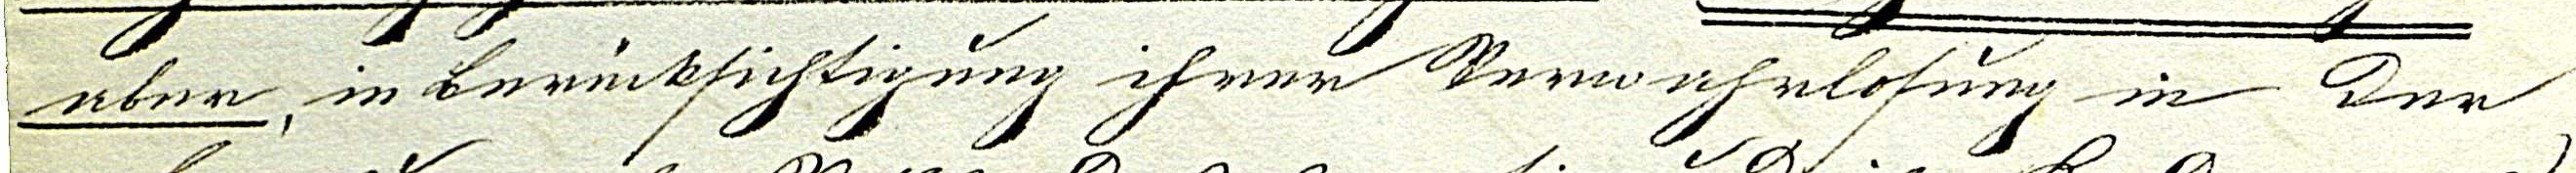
aber, in Berücksichtigung ihrer Verwahrlosung in der
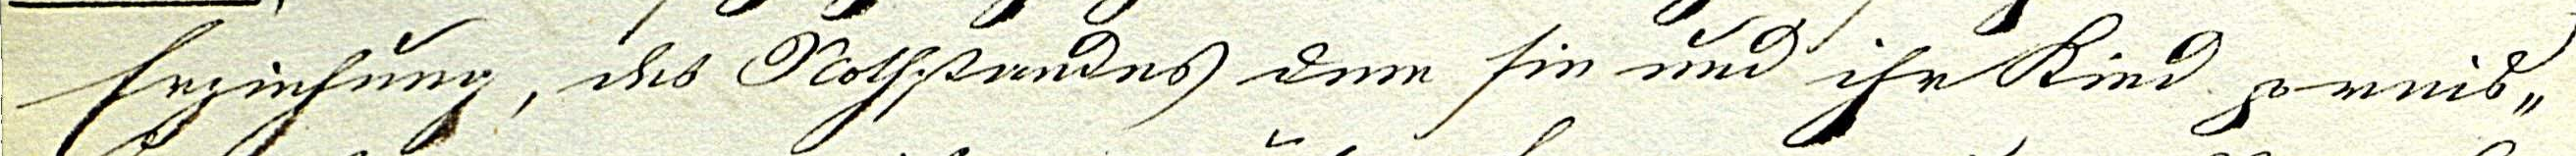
Erziehung, das Nothstandes dem sie und ihr Kind preis¬
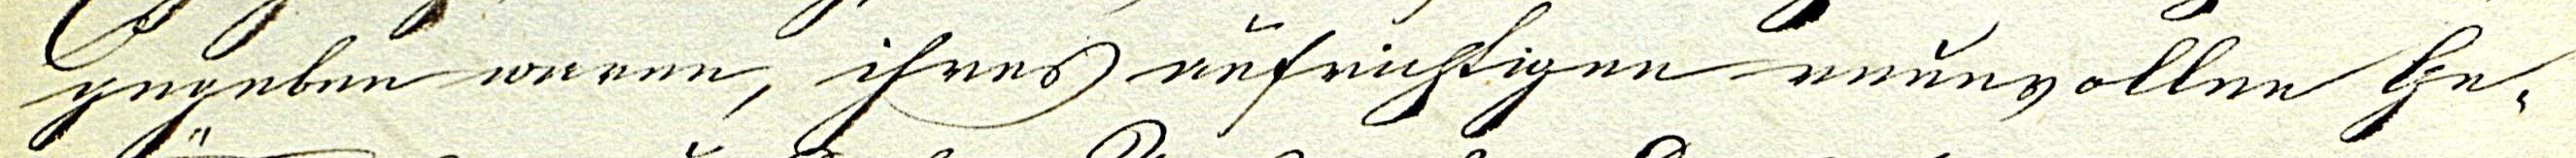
gegeben waren, ihres aufrichtigen reuevollen Ge¬
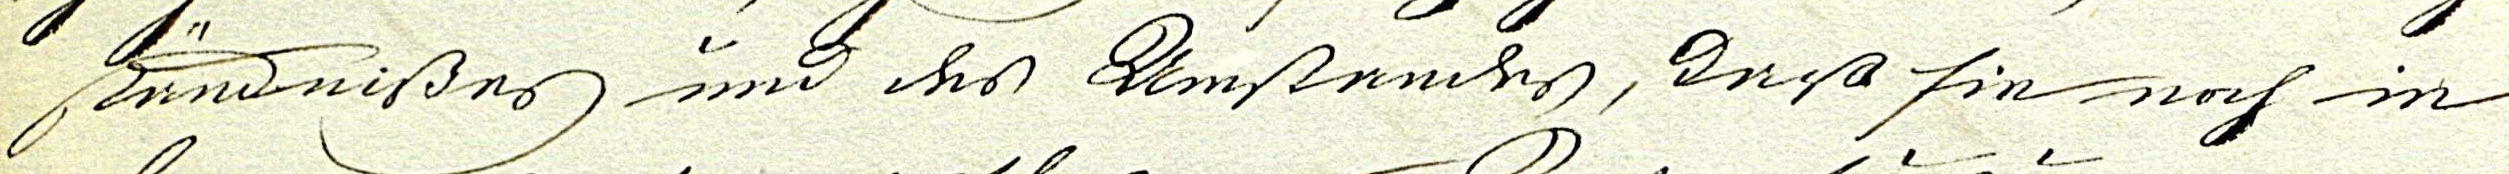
ständnißes und des Umstandes, daß sie noch in
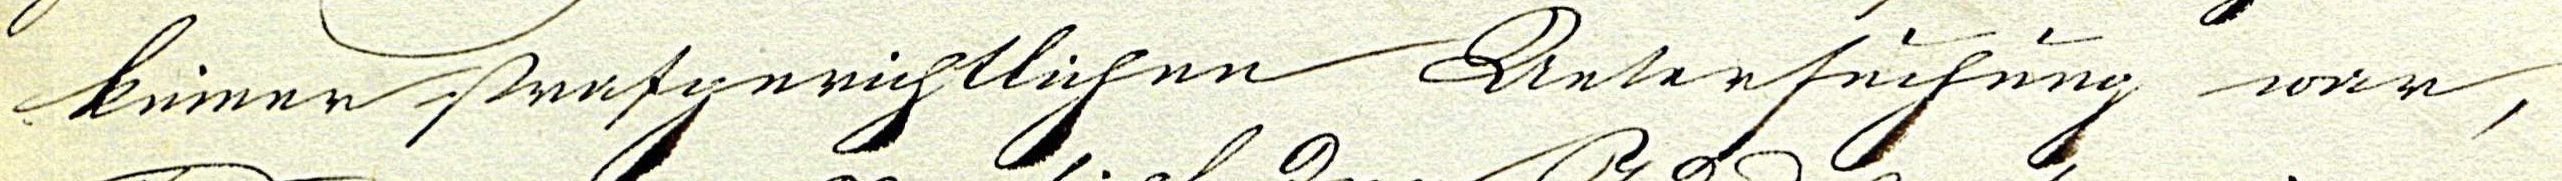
keiner strafgerichtlichen Untersuchung war,
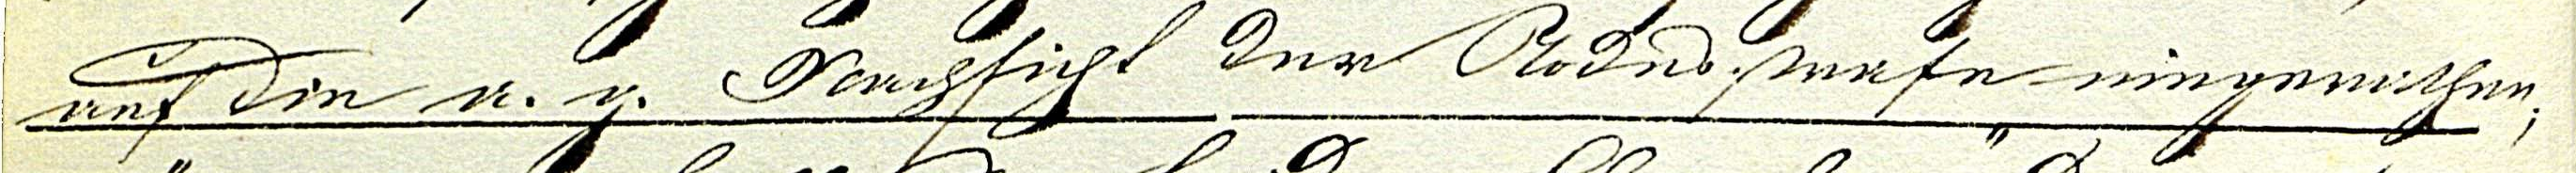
auf die a.g. Nachsicht der Todesstrafe eingerathen,
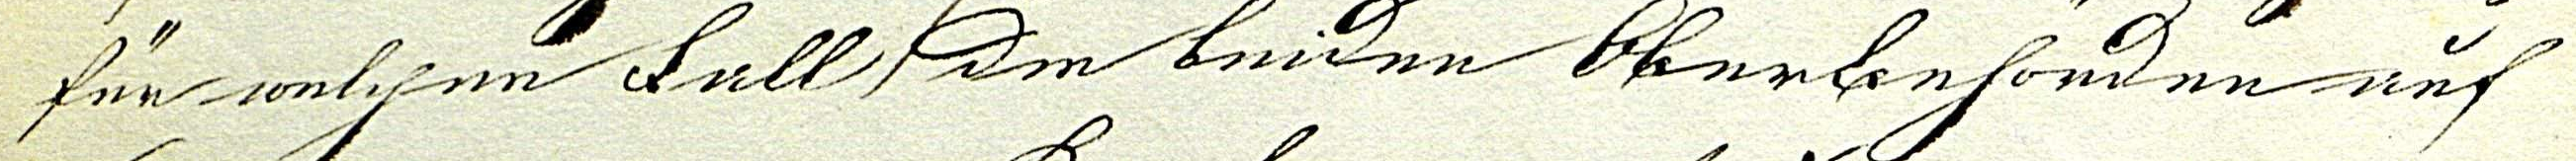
für welchen Fall die beiden Oberbehörden auf
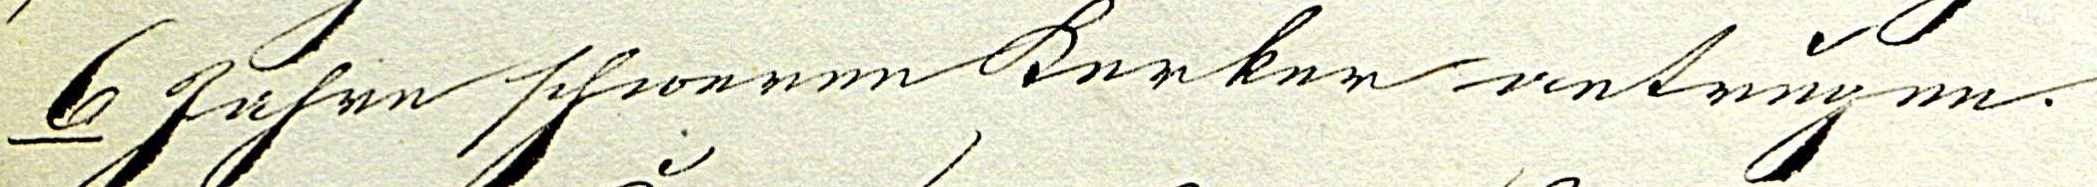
6 Jahre schweren Kerker antrugen.
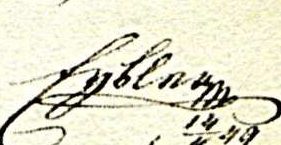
Eybler
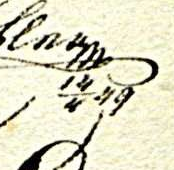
14/4/49
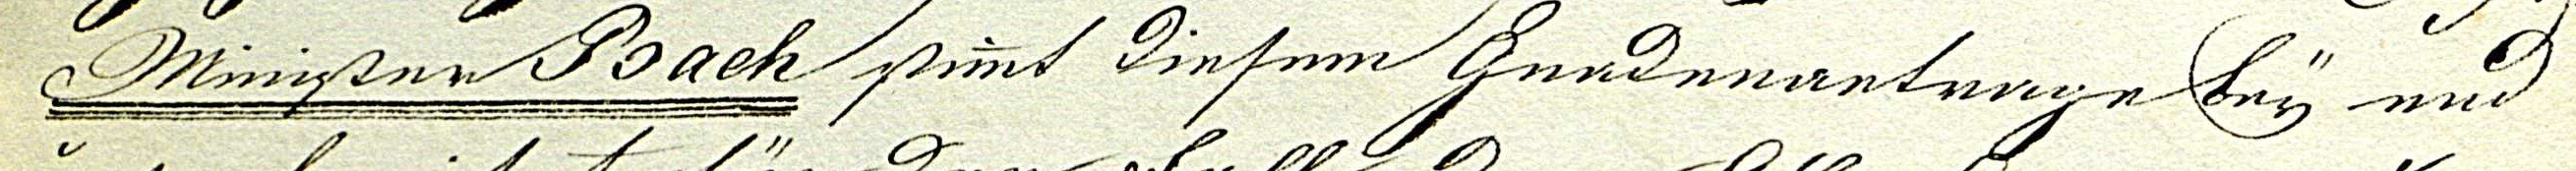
Minister Bach stimmt diesem Gnadenantrage bey und
